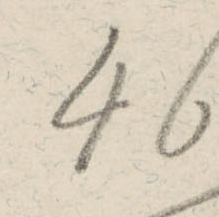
137.
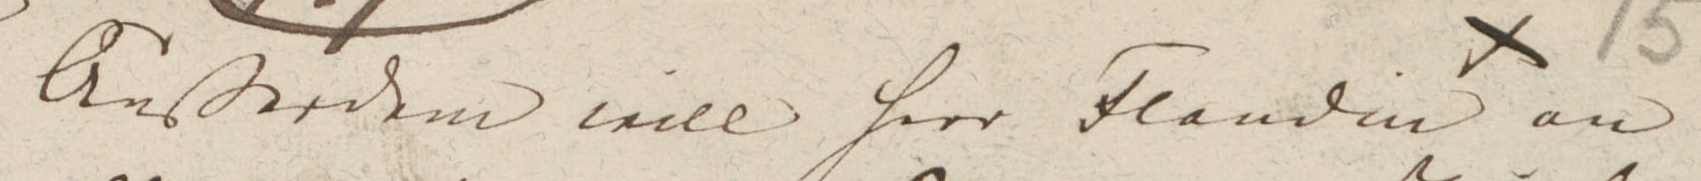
Ausserdem will Herr Flandin % an
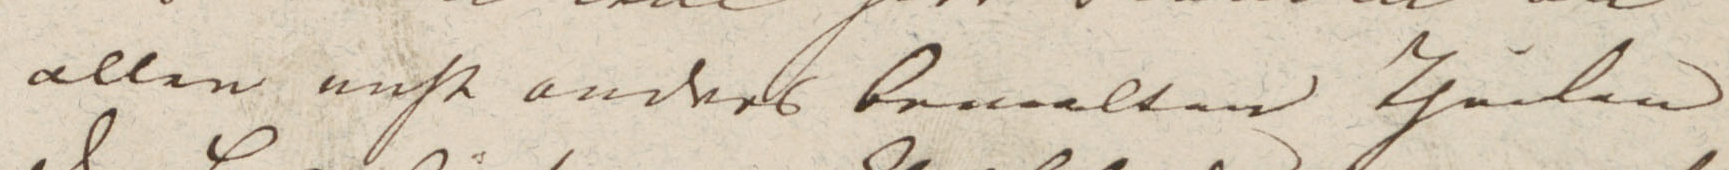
allen nicht anders bemalten Theilen
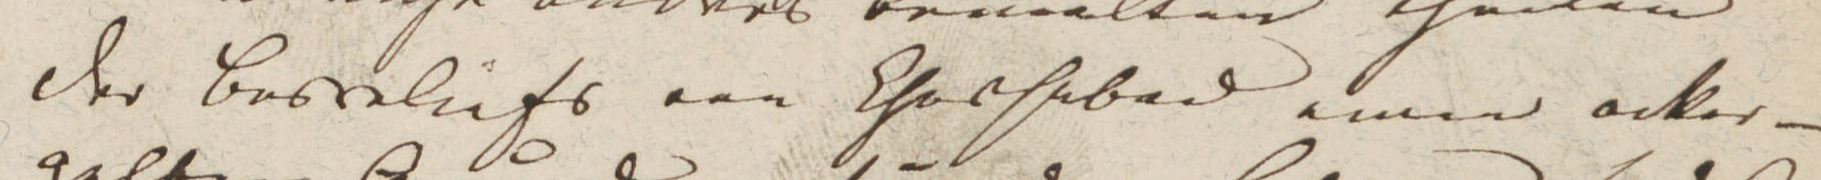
der Basreliefs von Chorsabad einen ocker-
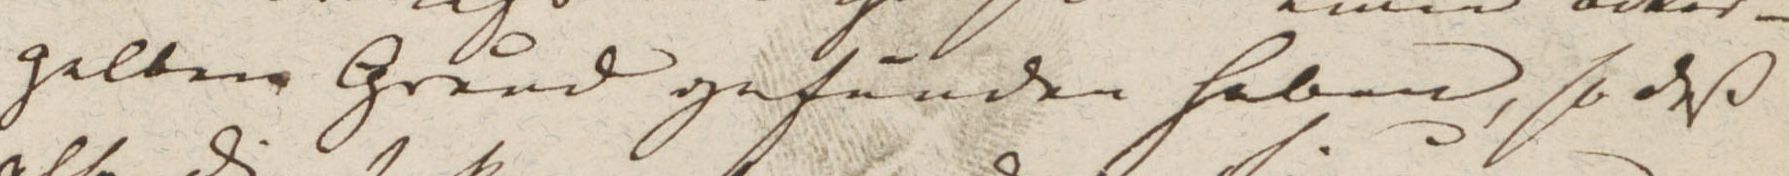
gelben Grund gefunden haben, so dass
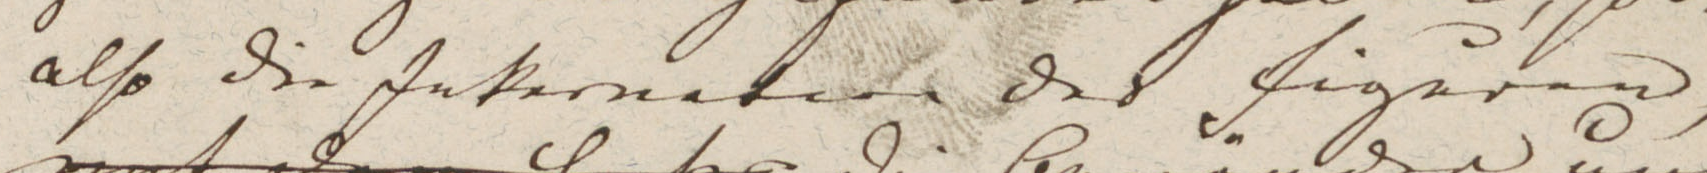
also die Inkarnation der Figuren,
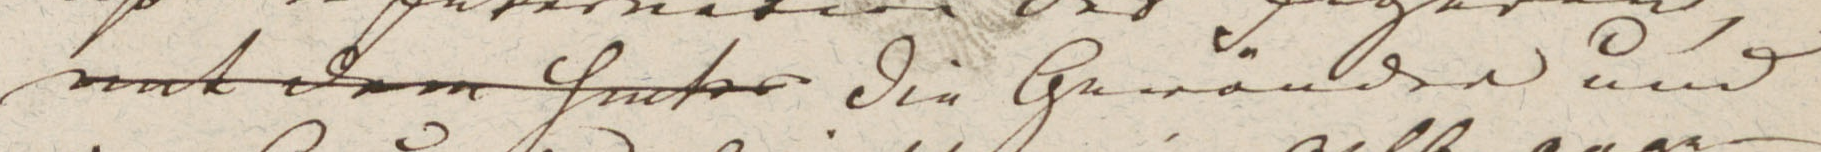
mit dem Hint die Gewänder und
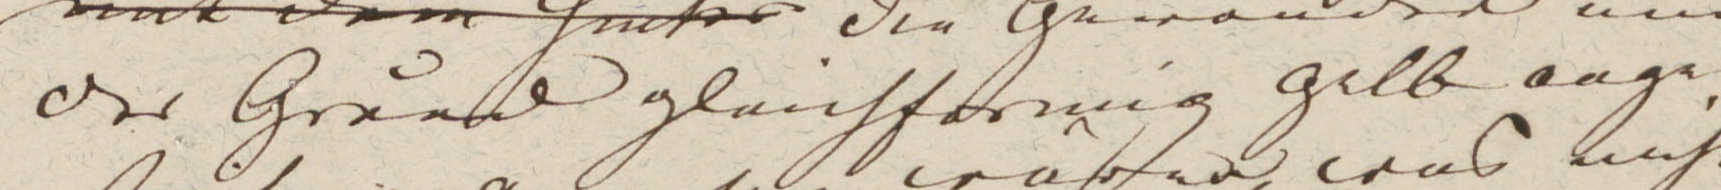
der Grund gleichformig gelb ange-
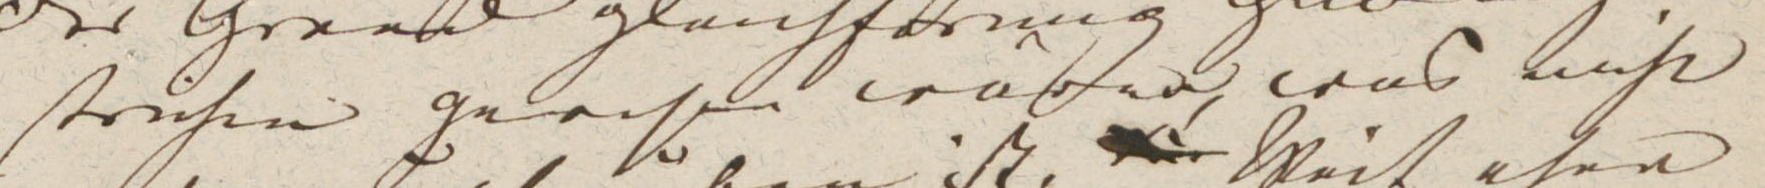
strichen gewesen wären, was nicht
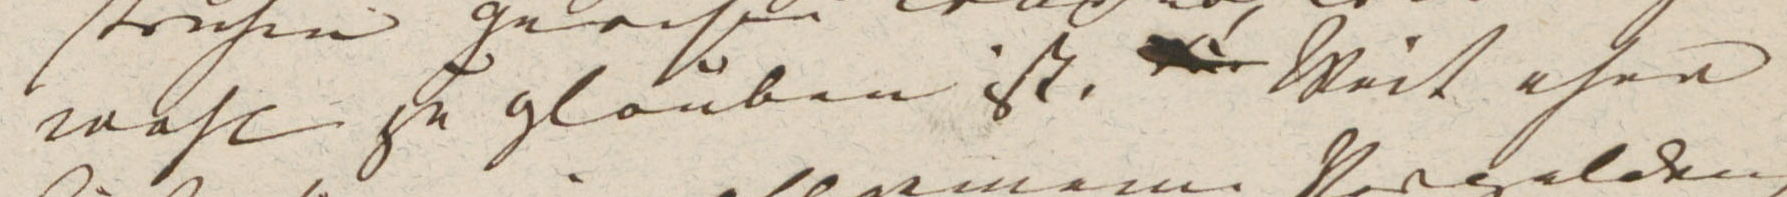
wohl zu glauben ist. % Weit eher
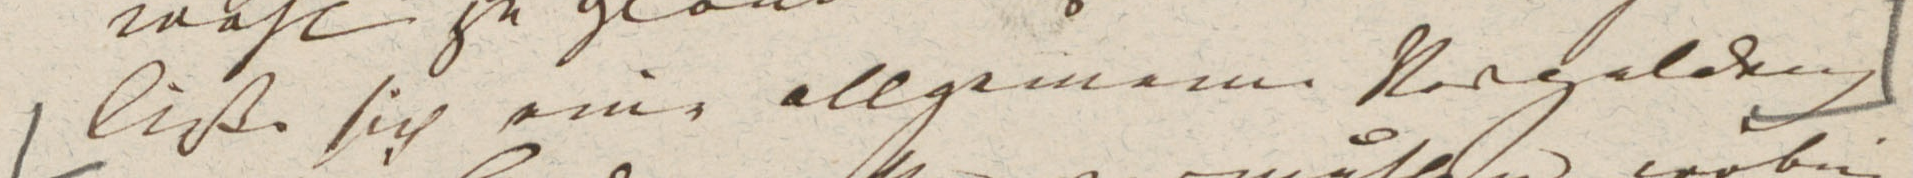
%liesse sich eine allgemeine Vergoldung %
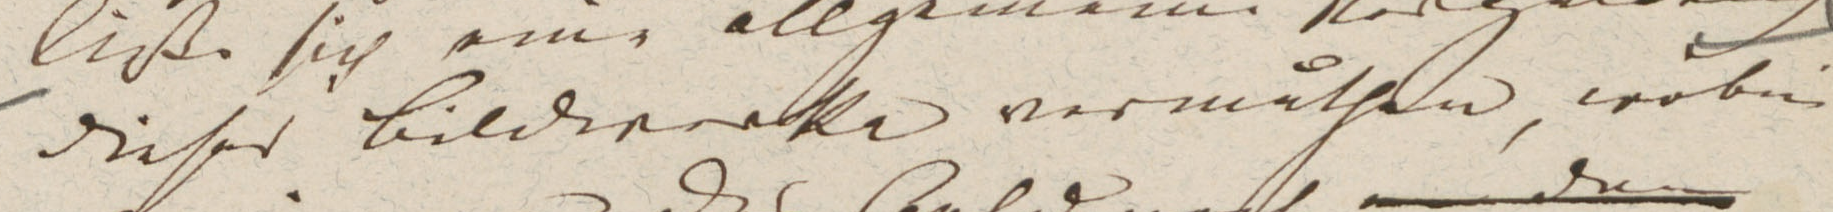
dieser Bildwerke vermuthen, wobei
